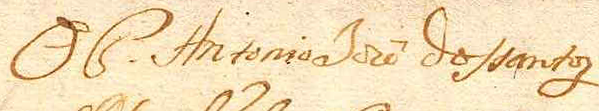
O P. Antonio Iozé dos santoz
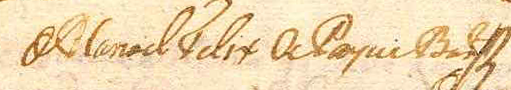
Manoel Felix de Payua Bar
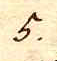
5.
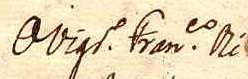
O Vigr.o Fran.co Ri
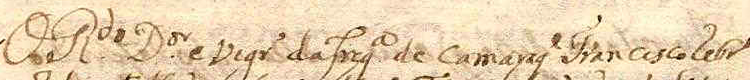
O R.do D.or e Vigr.o da freg.a de Camango Francisco Rebro
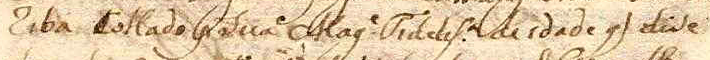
Riba. Collado p̄ Sua Mag.e Fidelis.a de idade q̄ dise
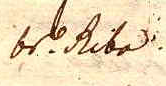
br.o Riba.
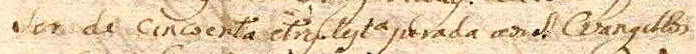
ser de cincoenta e tres testa jurada ao s Evangelhos
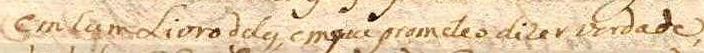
em hum Livro deles, em que prometeo dizer verdade,
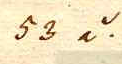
53 as.
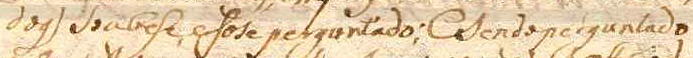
do q̄ soubese, e fose perguntado; E Sendo perguntado
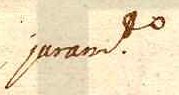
juram.to
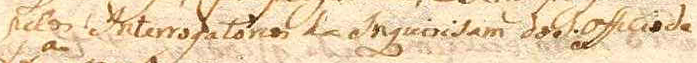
pelos Interrogatorios da Inquirisam do s.to Officio de
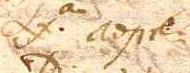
Lx.a ao pr.o
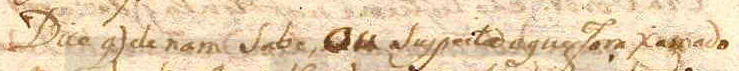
Dice q̄ de nam sabe, ou suspeita a que fora xamado
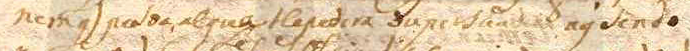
nem q̄ pesoa algua lhe pedira ou persuad_ a q̄ sendo
